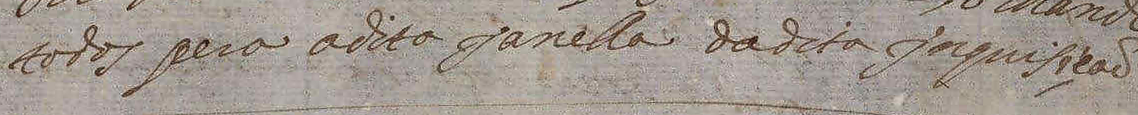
todos pera a dita janella da dita jnquisiçaõ
